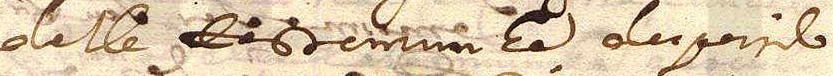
delle testemunha despois do
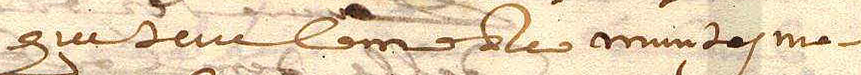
que teue Com o Reo muntas ma
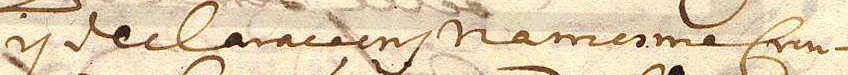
is declaraçoens na mesma Cren
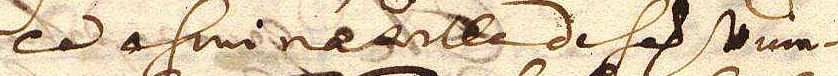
ça asim na villa de saõ vicen
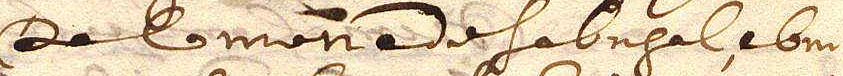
te Como na do sabugal, e com
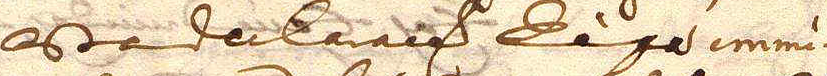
esta declaraçaõ há por emmē
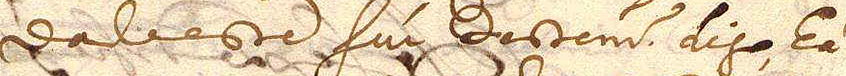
dado este seu testem.o digo há
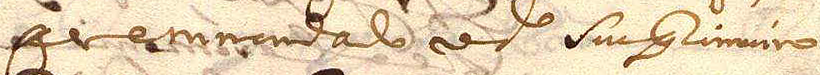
por emmendado o d.o seu primeiro
